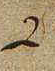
2
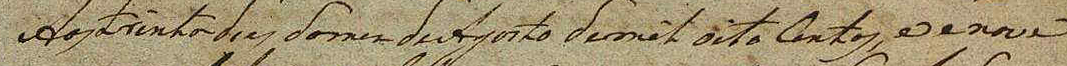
Aos trinta dias do mez de Agosto de mil oitoCentos, e e nove
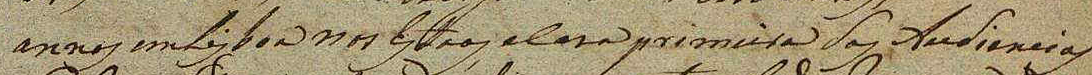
annos em Lisboa nos Estaos, e Caza primeira das Audiencias
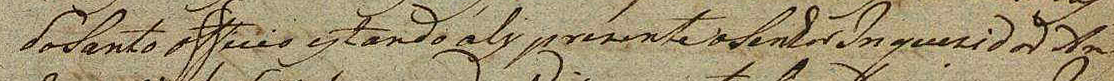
do Santo officio estando ahy prezente o Senhor Inquizidor An
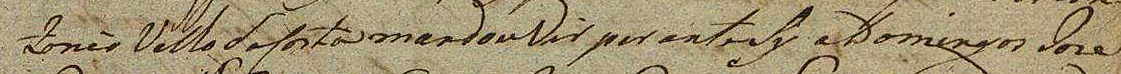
tonio Velho da Costa mandou Vir perante Sy a Domingos Ioze
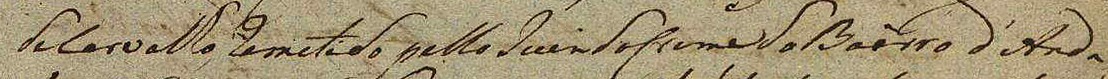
de Carvalho, Remetido pello Iuiz do Crime do Bairro d'Anda
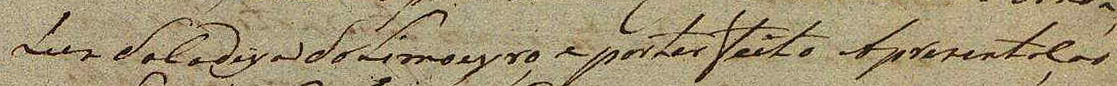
Luz da Cadeya do Limoeyro, e por ter feito Aprezentaçaõ
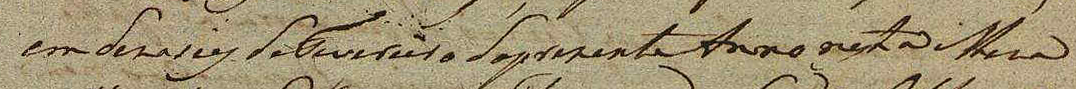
em dezaseis de Fevereiro do prezente Anno nesta Meza
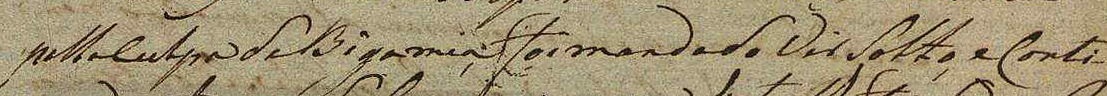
pella Culpa de Bigamia, foi mandado Vir Solto, e Conti
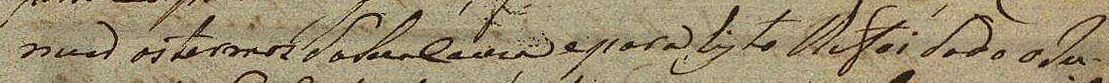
nuar os termos da Sua Cauza e para histo lhe foi dado o Iu
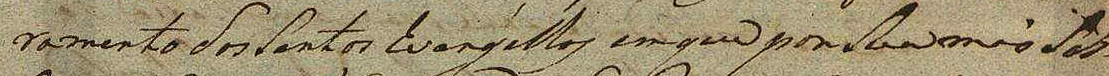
ramento dos Santos Evangelhos em que poz a sua maõ sob
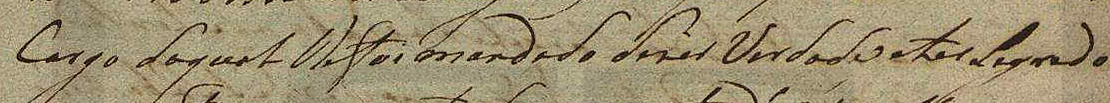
Cargo do qual lhe foi mandado dizer Verdade e ter segredo
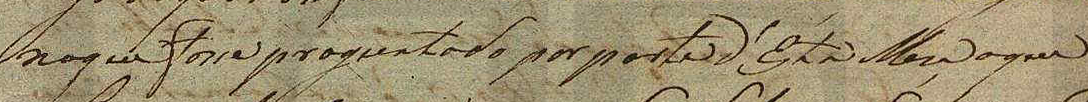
no que fosse proguntado por parte d'Esta Meza, o que
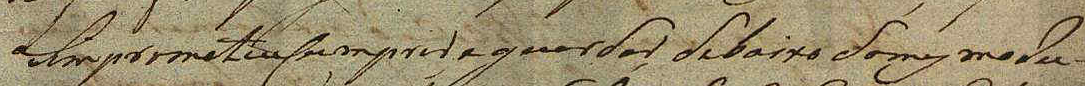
asim prometeu Cumprir, e guardar, debaixo do mesmo Iu
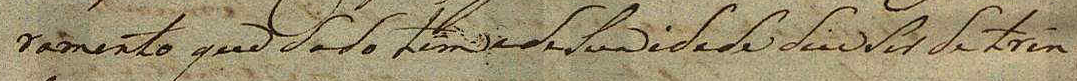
ramento que dado tem e da sua idade dice ser de trin
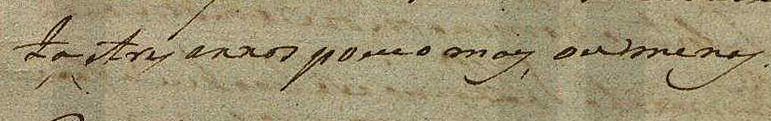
ta e tres annos pouco mais, ou menos.
